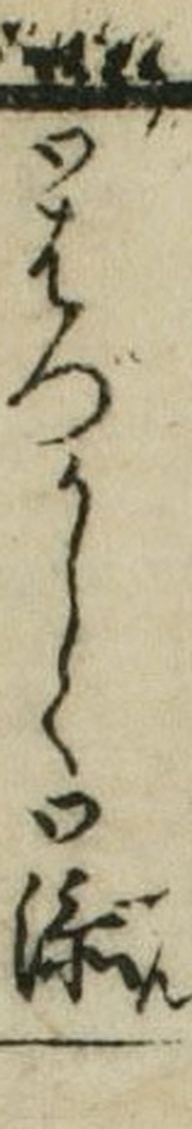御はづかしく御添
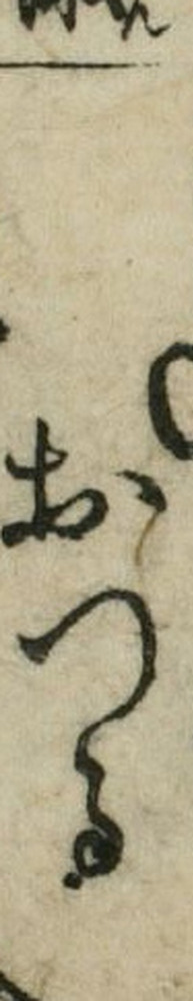おつる
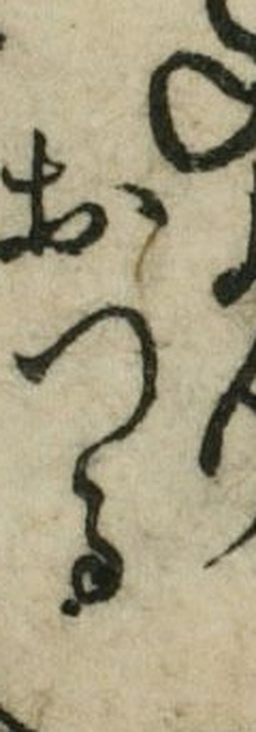おつる
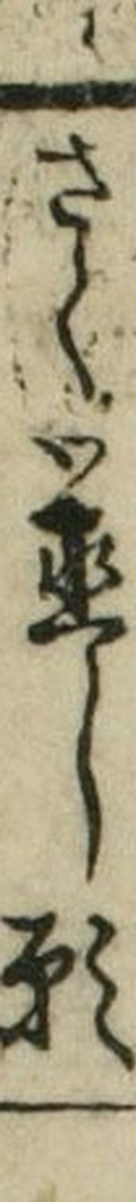さく御直し願
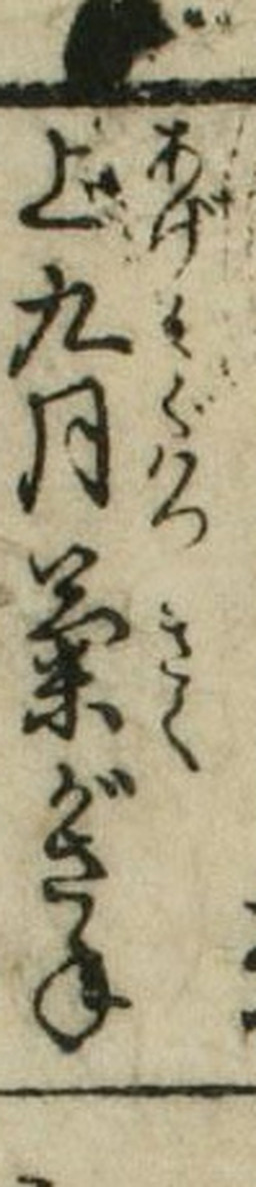上九月菊がさね
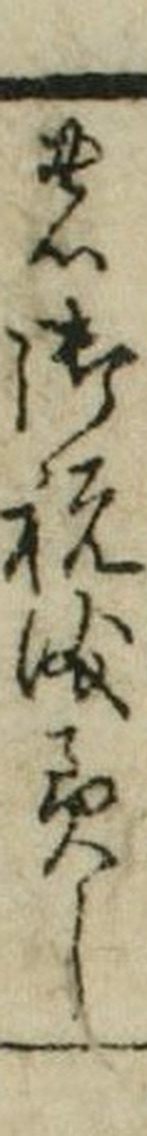の御祝儀美し
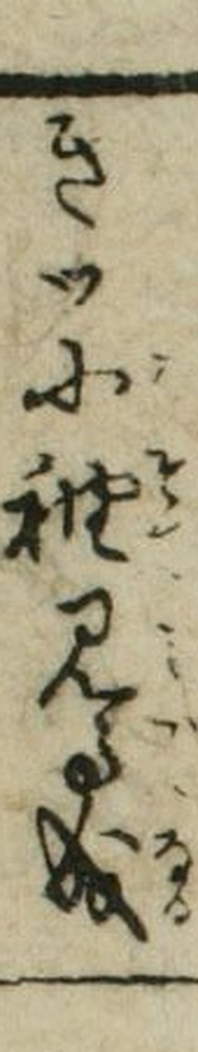き御小袖見事成
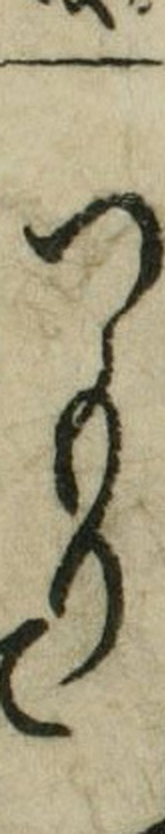つもりて
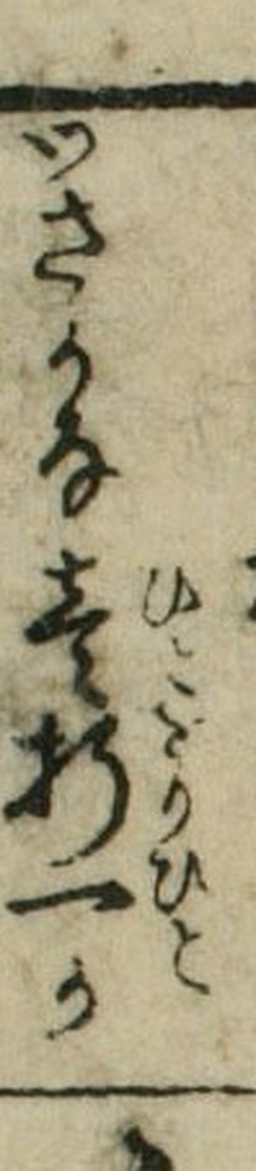御さかな壱折一か
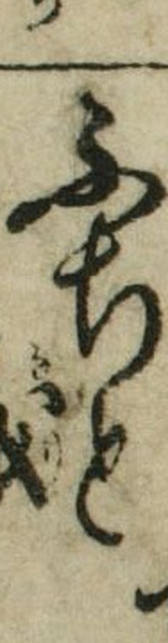ふちと
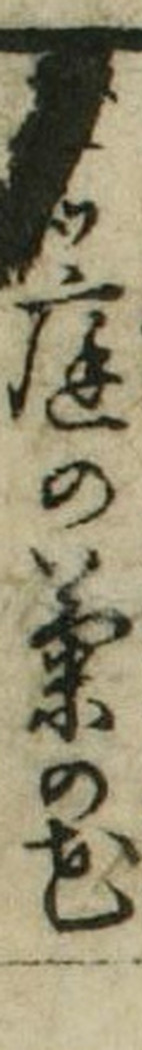御庭の菊の花
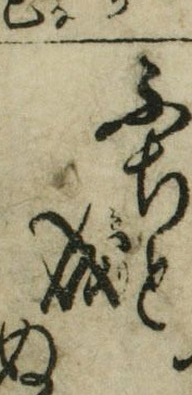ふちと

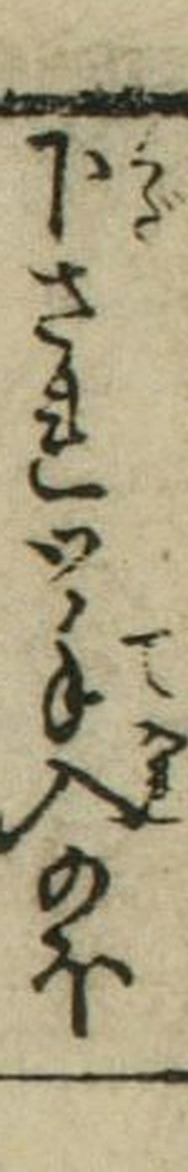下され御手入のほ
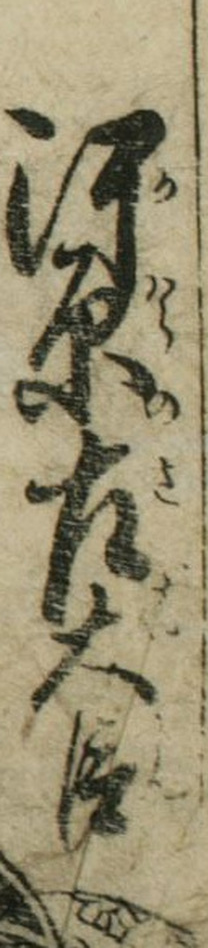河原左大臣
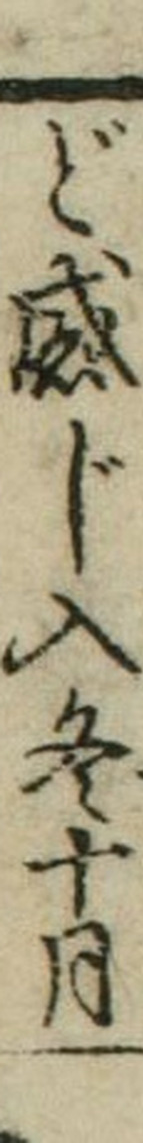ど感じ入冬十月
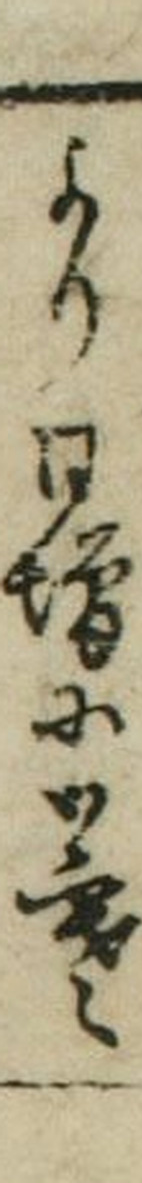より日増に御寒
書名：百人一首
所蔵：東京学芸大学教育コンテンツアーカイブ
